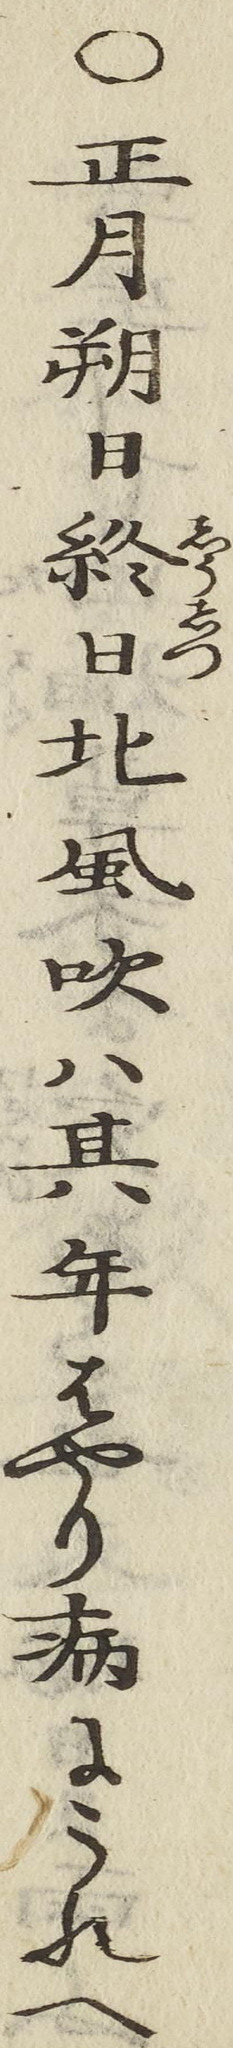〇正月朔日終日北風吹は其年はやり病にうれへ
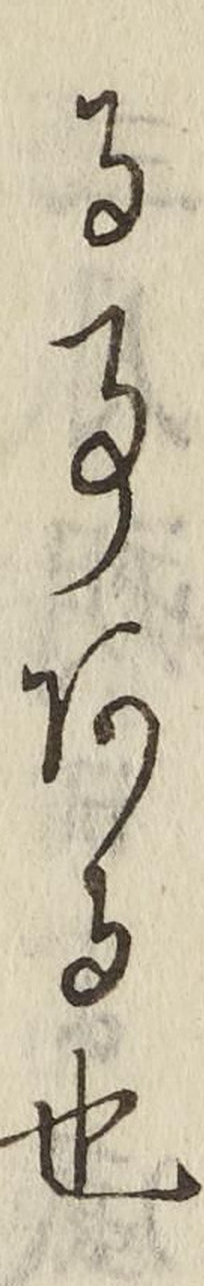る事ある也
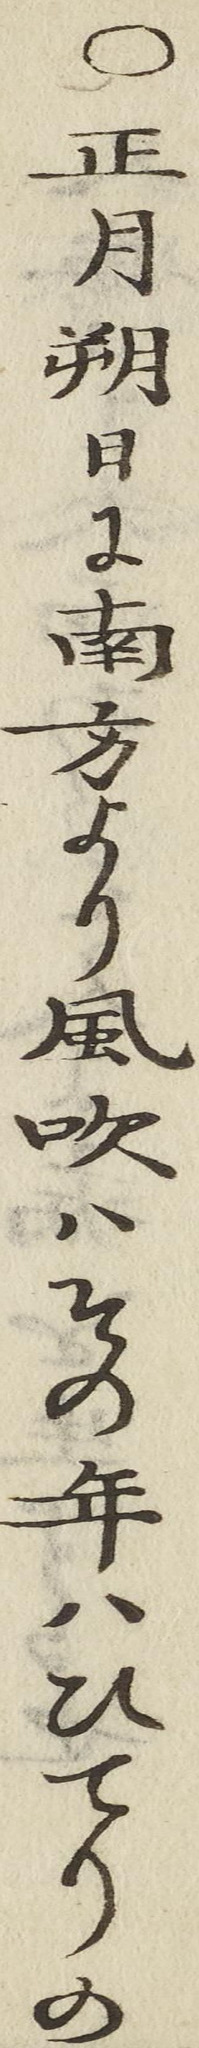〇正月朔日に南方より風吹はその年はひてりの
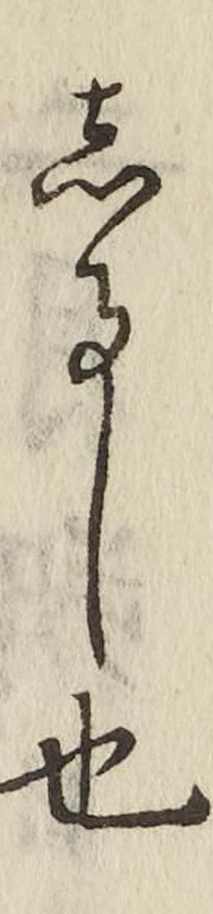しるし也
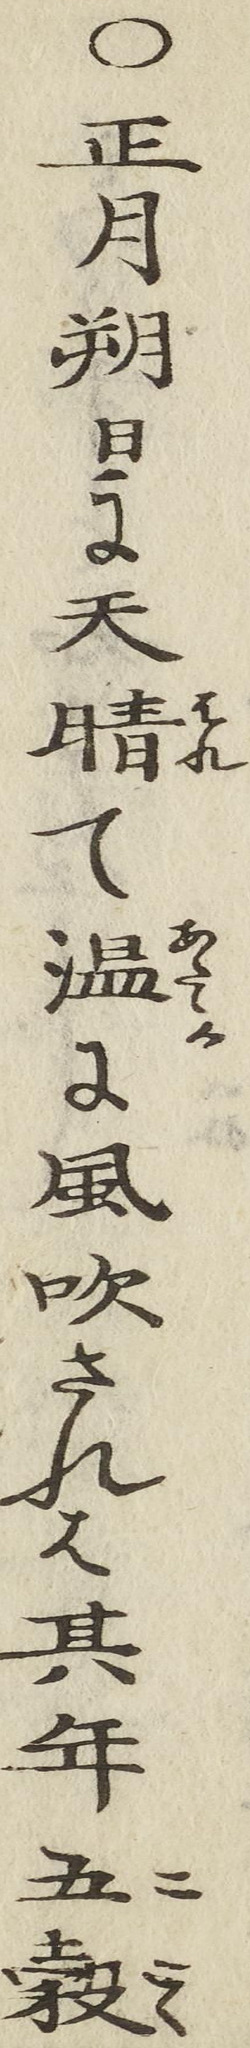〇正月朔日に天晴て温に風吹されは其年五穀
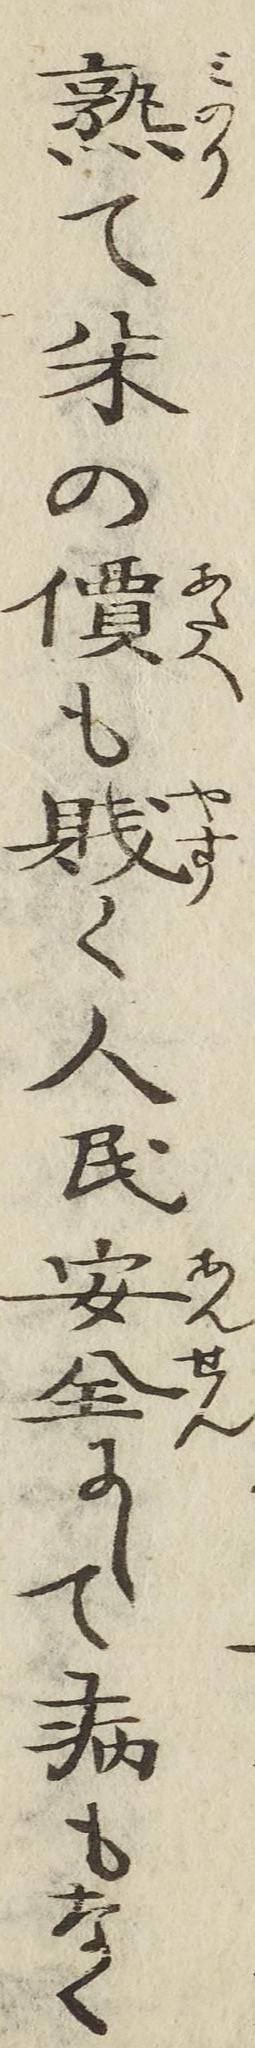熟て米の価も賤く人民安全にして病もなく
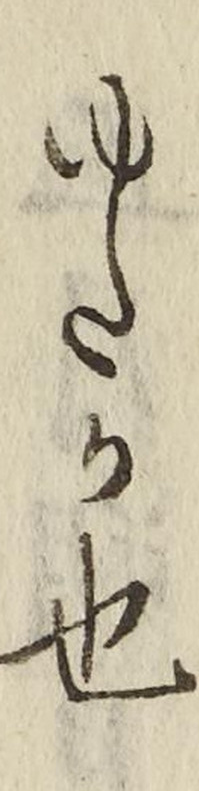ゆたか也
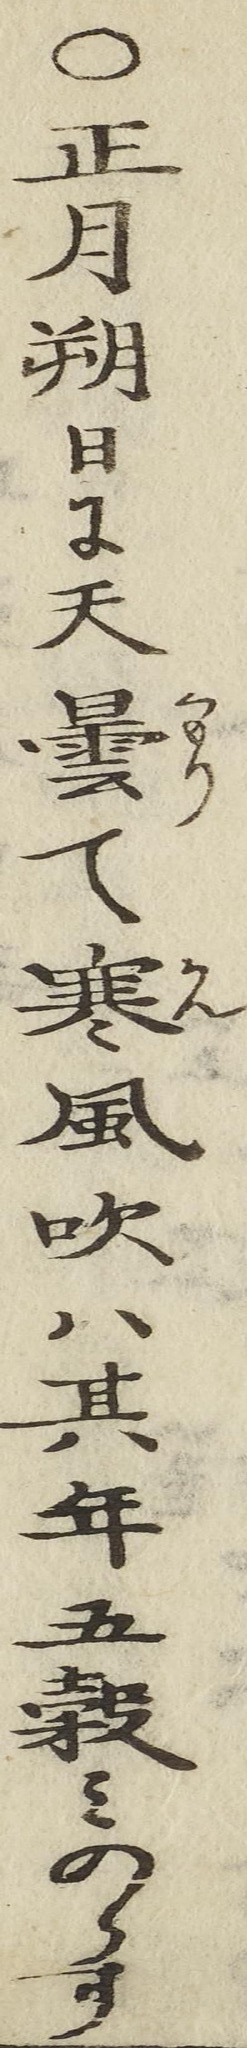〇正月朔日に天曇て寒風吹は其年五穀みのらす
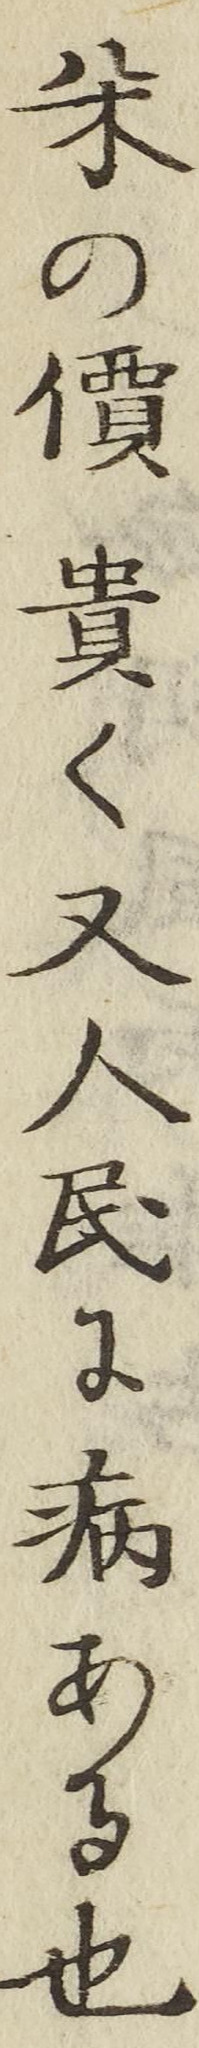米の価貴く又人民に病ある也

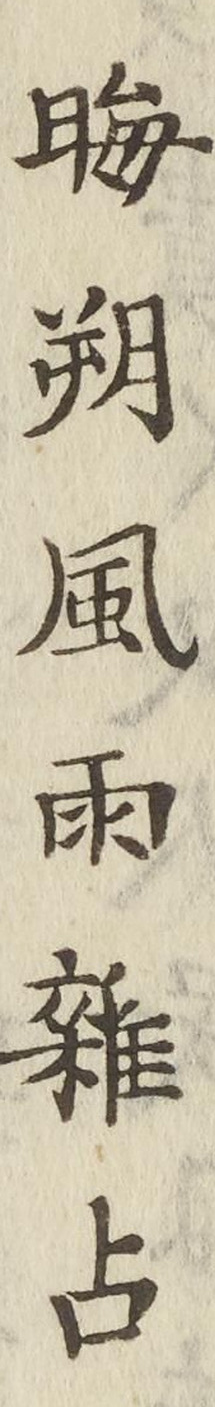晦朔風雨雑占
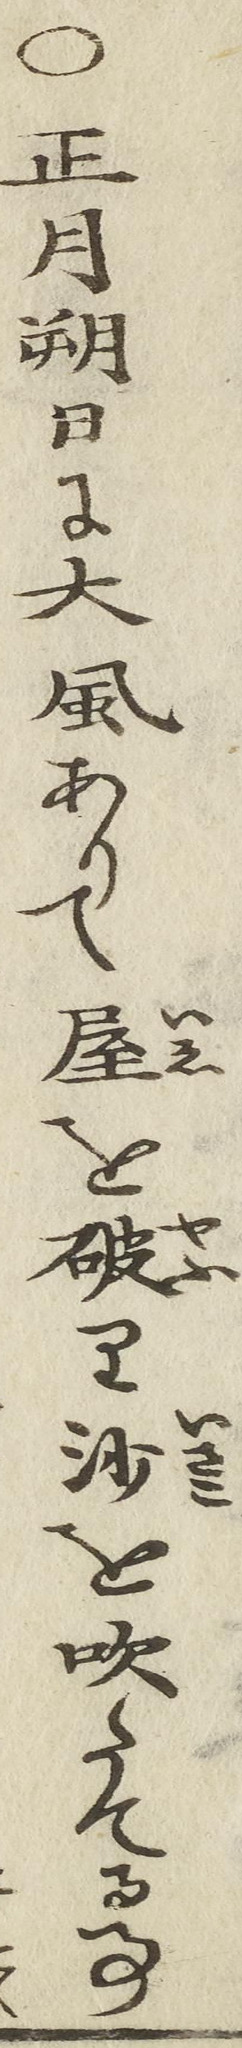〇正月朔日に大風ありて屋を破り沙を吹たてる事
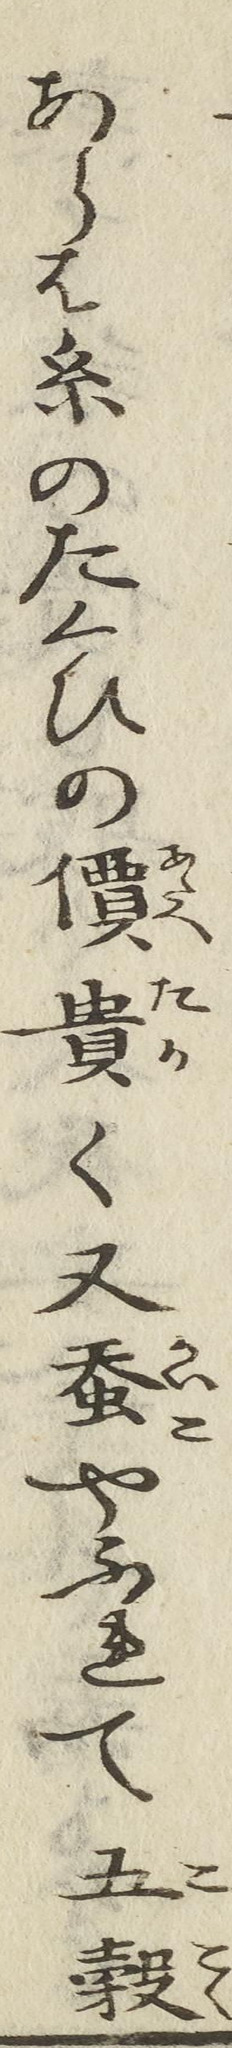あらは糸のたくひの価貴く又蚕やふれて五穀
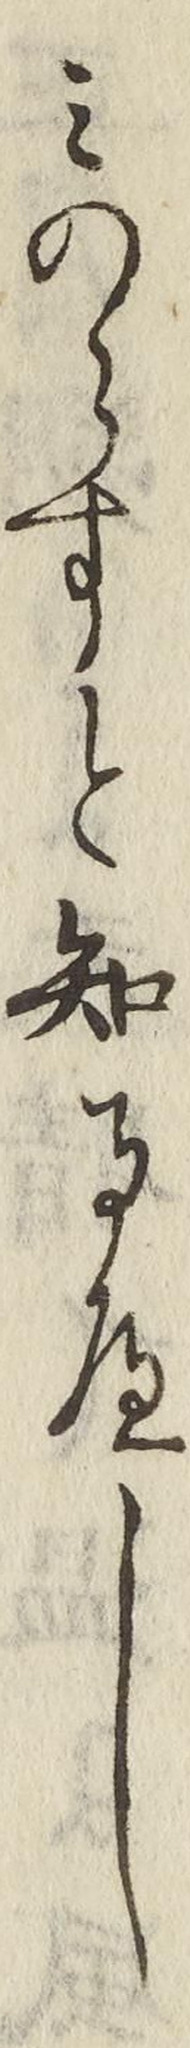みのらすと知るへし
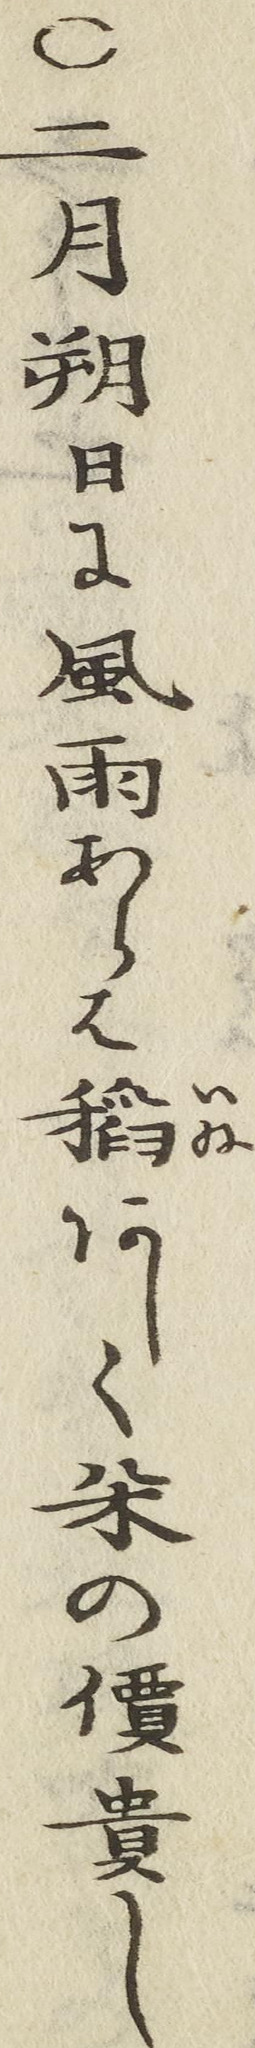〇二月朔日に風雨あらは稲あしく米の価貴し
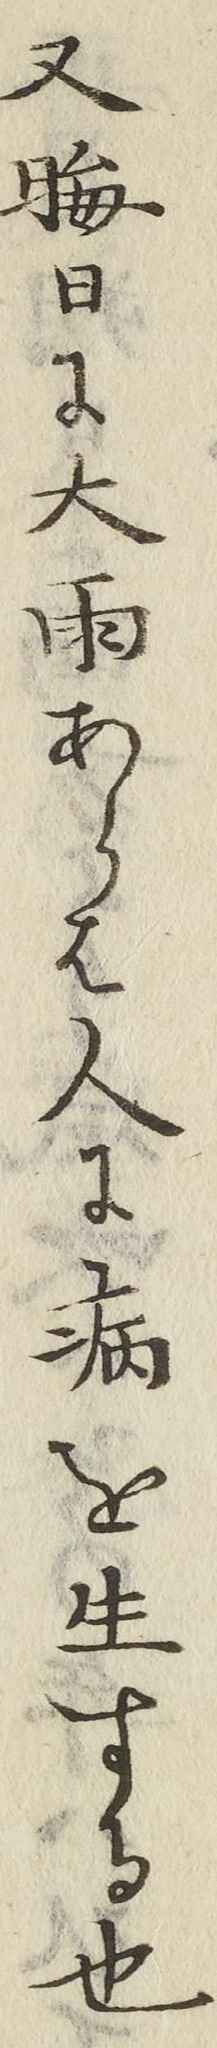又晦日に大雨あらは人に病を生する也
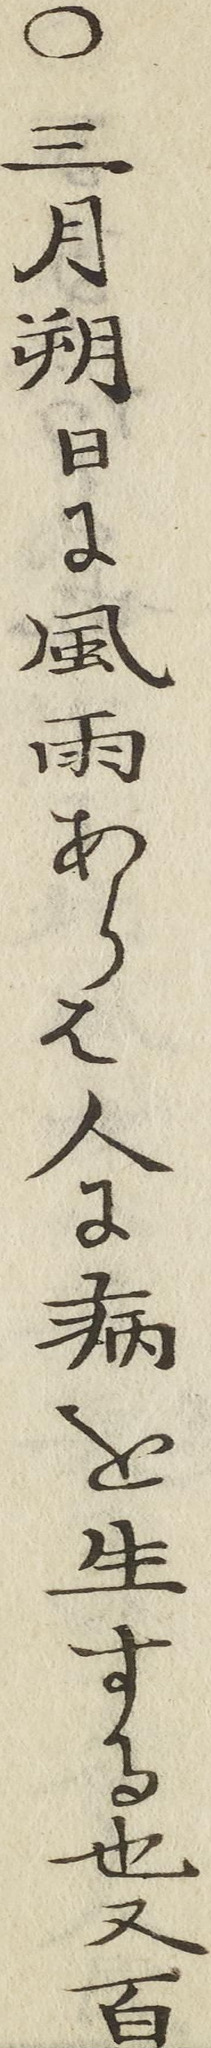〇三月朔日に風雨あらは人に病を生する也又百
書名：天時占候　二
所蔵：東京大学地震研究所図書室 Earthquake Research Institute Library, The University of Tokyo, JAPAN
